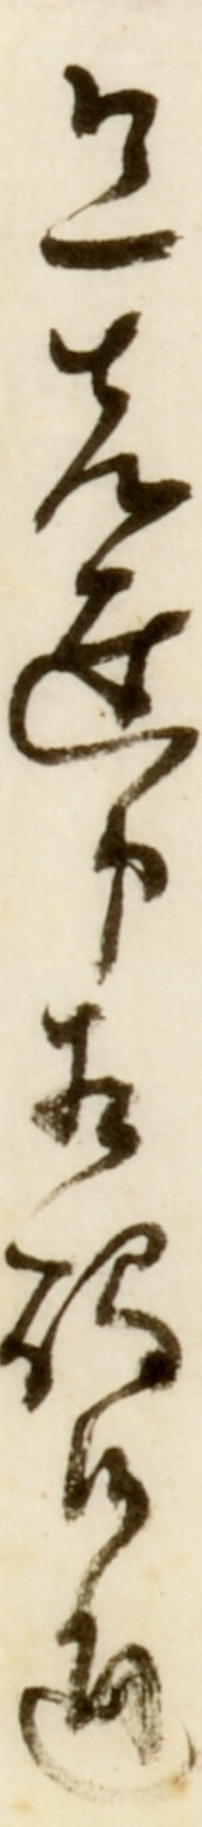且先達而相触候通
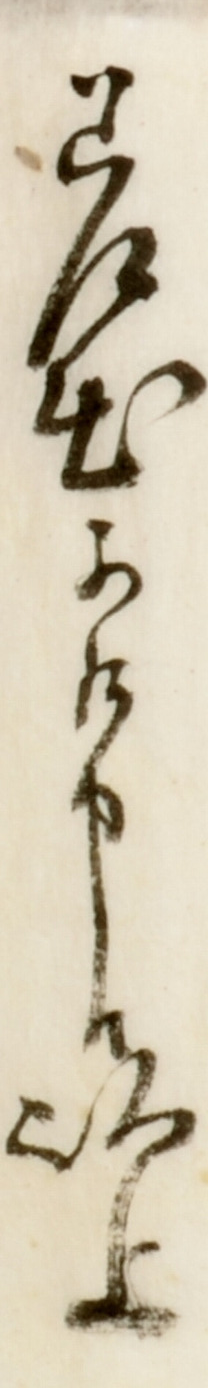差出可被申候以上
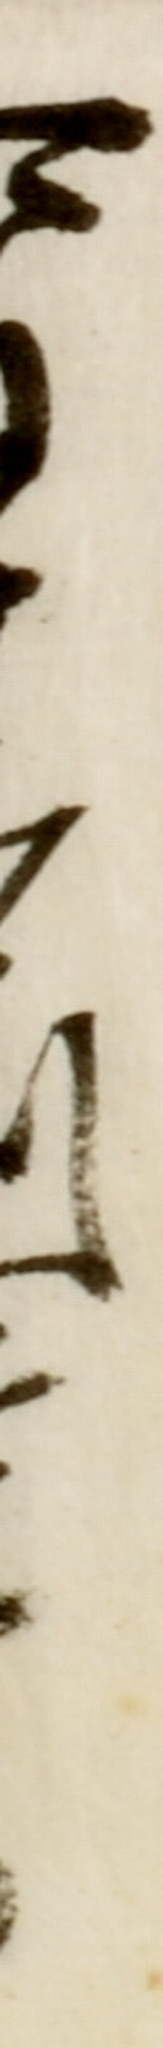四月十三日測量方

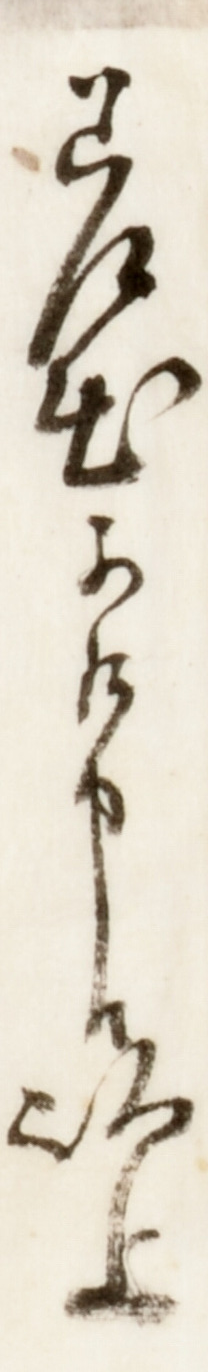差出可被申候以上
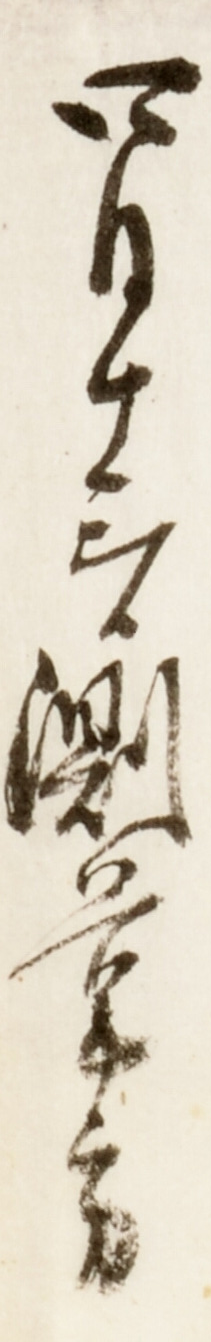四月十三日測量方
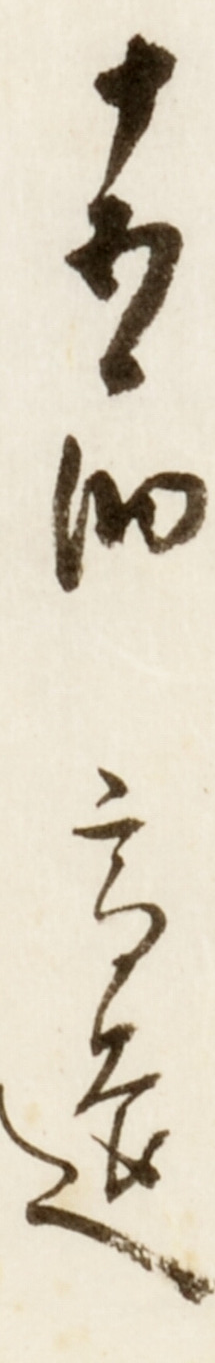十五日泊高遠
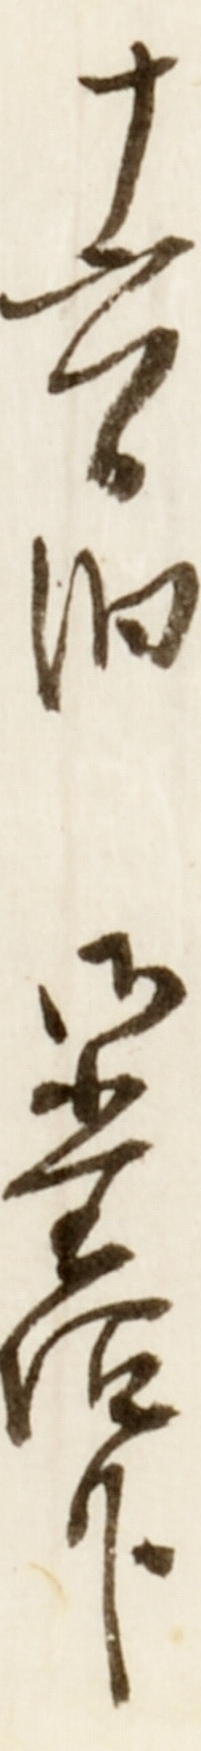十六日泊御堂垣外
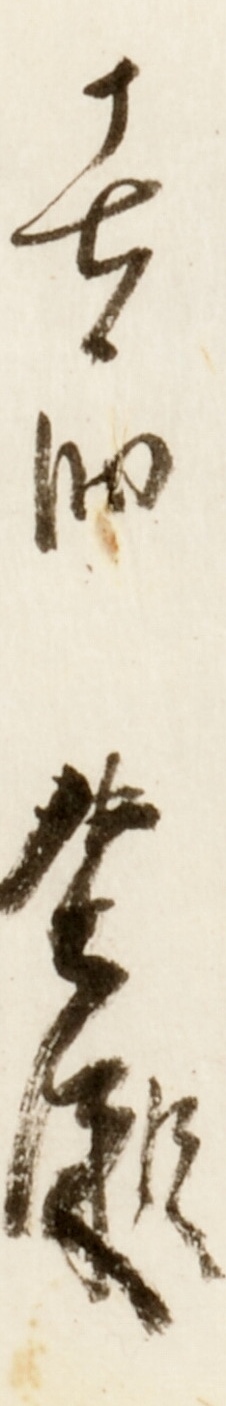十七日泊金沢
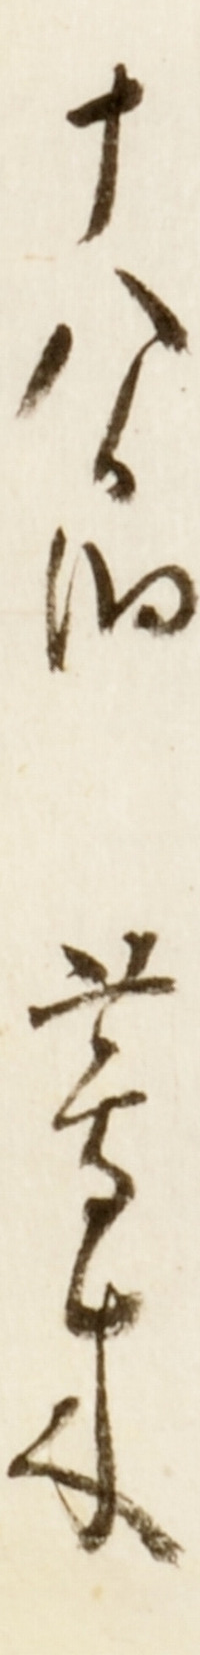十八日泊蔦木
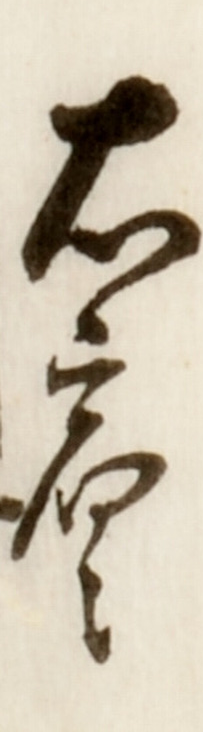右宿々
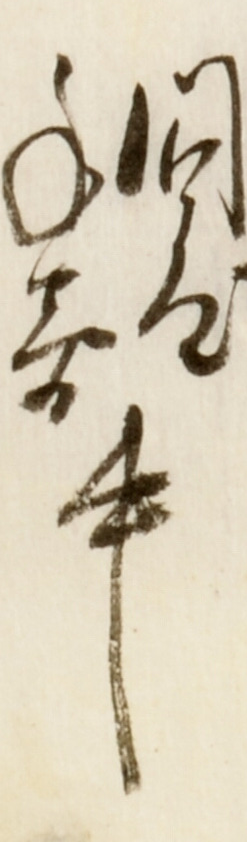年寄中
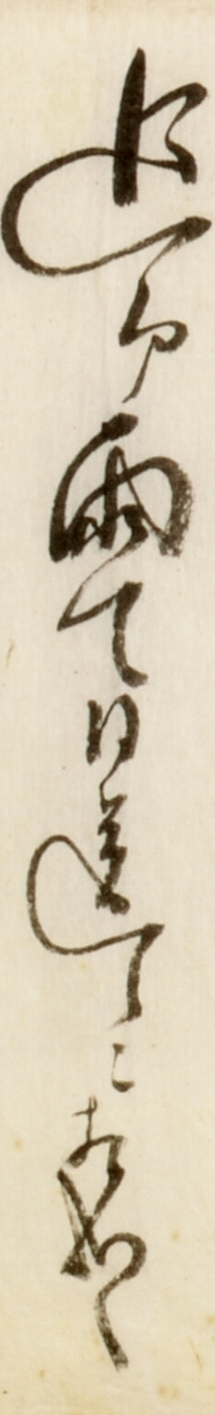追而雨天日送ニ相成候
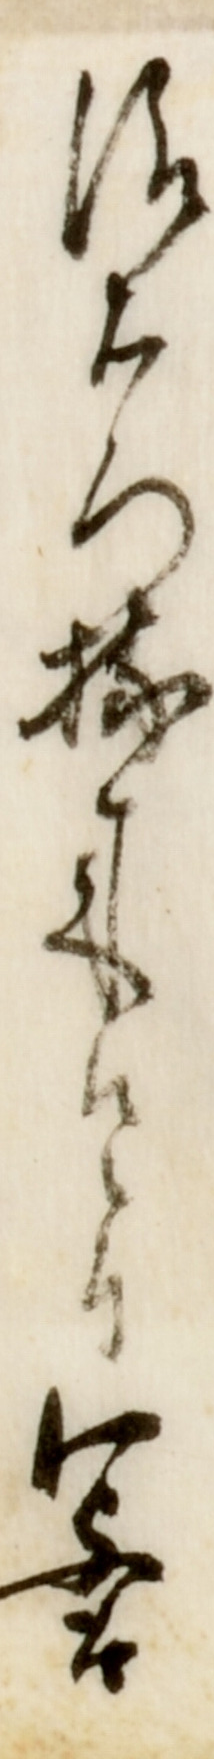治右衛門持来候ニ付写取

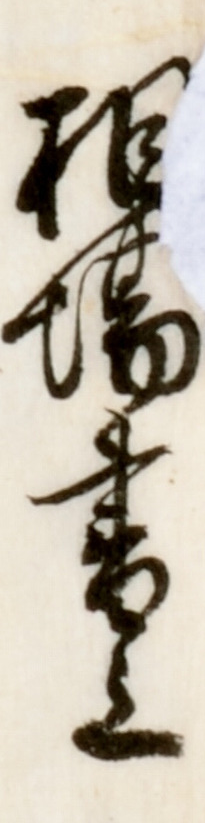相場書上
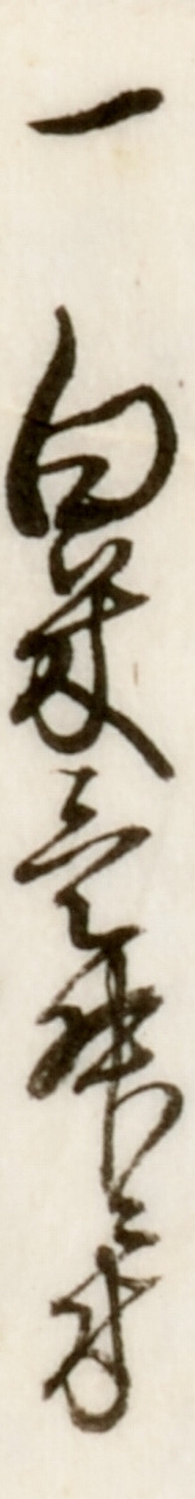一白米壱升ニ付
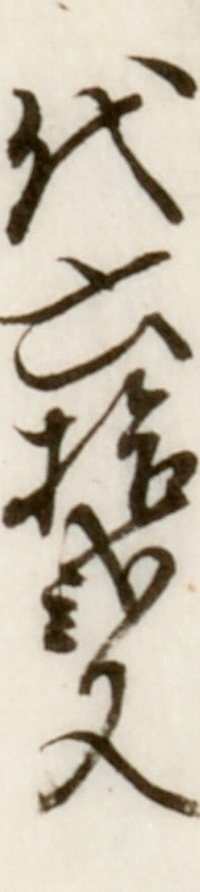代六拾弐文
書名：諸事控帳
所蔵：伊那市立高遠町図書館・合同会社AMANE
